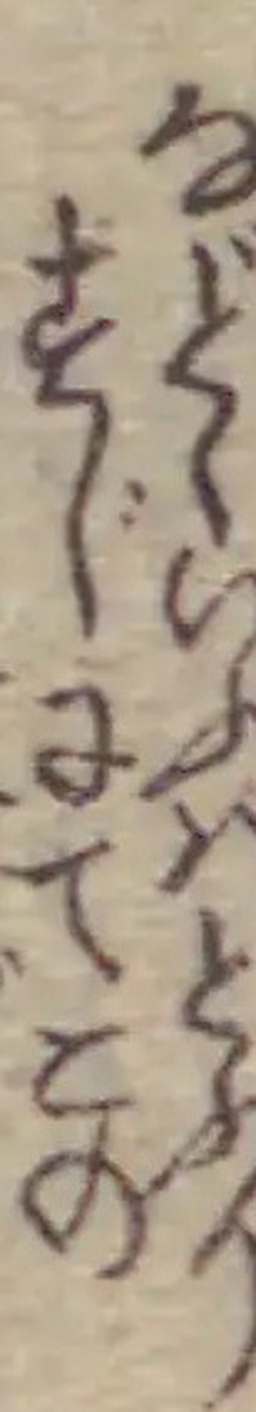すじにてこの
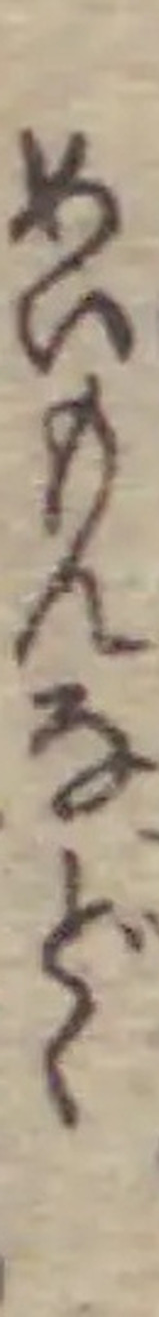めいもんなどゝ
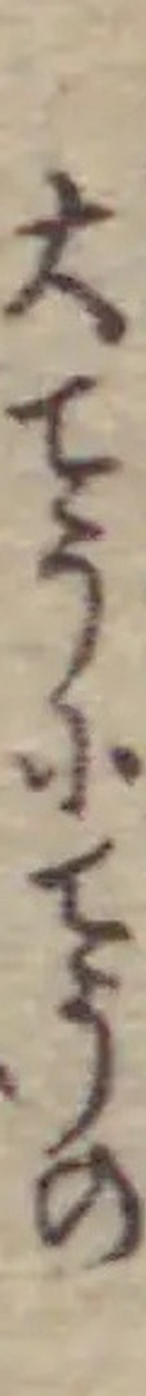大てう小てうの
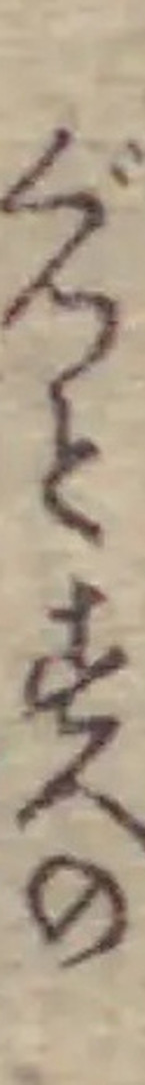ぐつとすへの
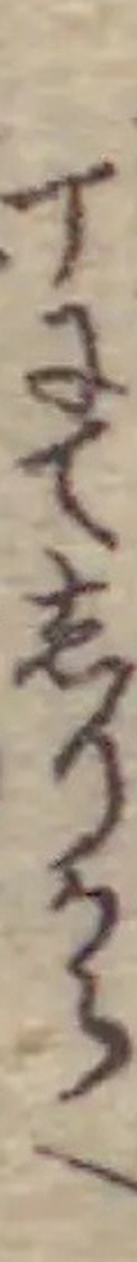丁にてしりから
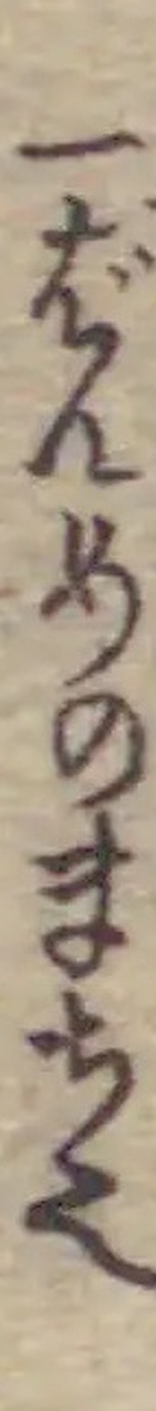一ばんめのまち也
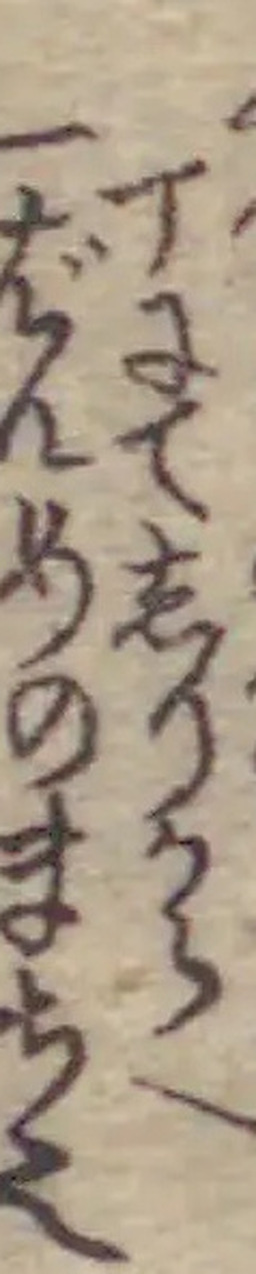一ばんめのまち也

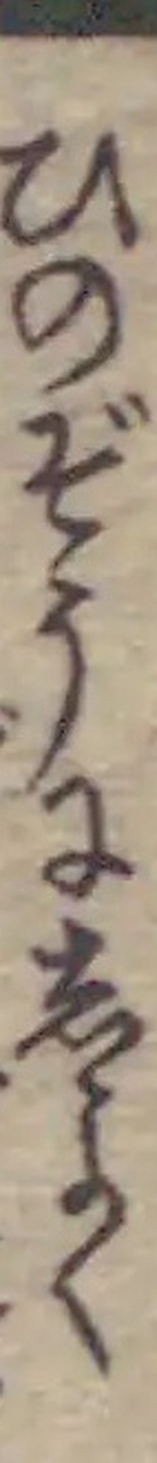ひのぞうにしよく
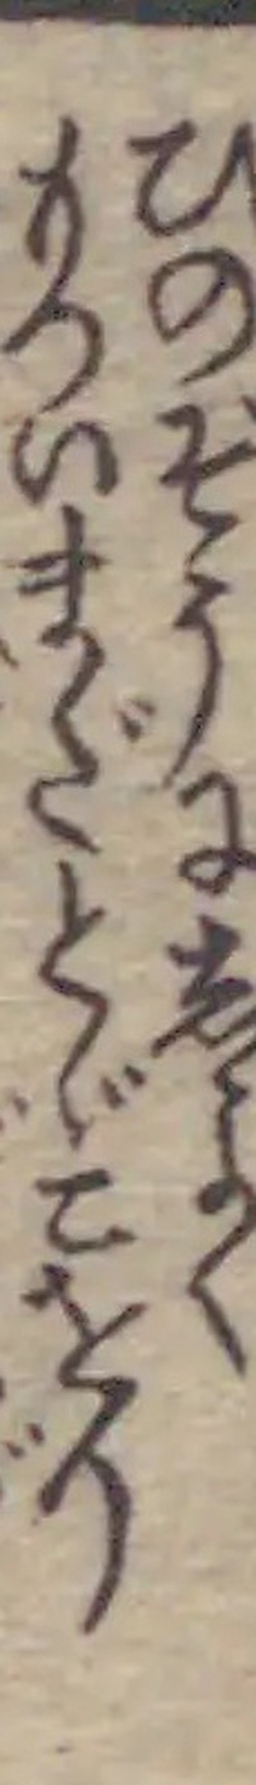もついまだとゞこをり
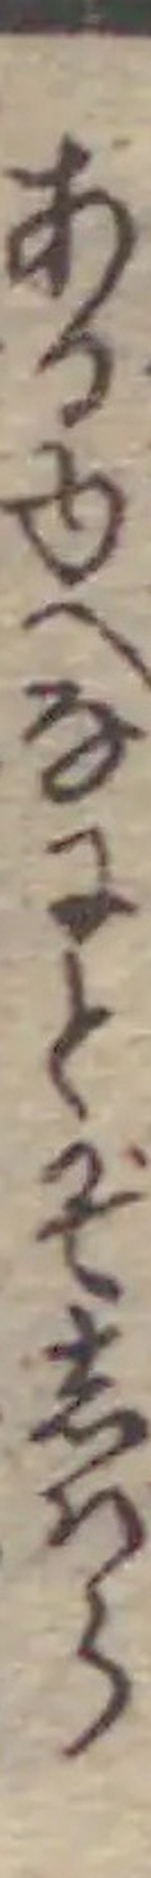あるゆへなにとぞしばら
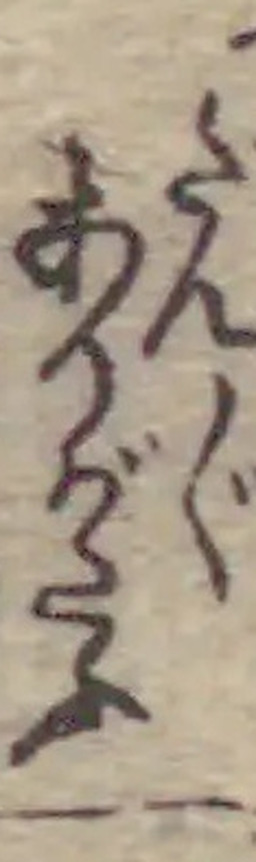ありがたふ
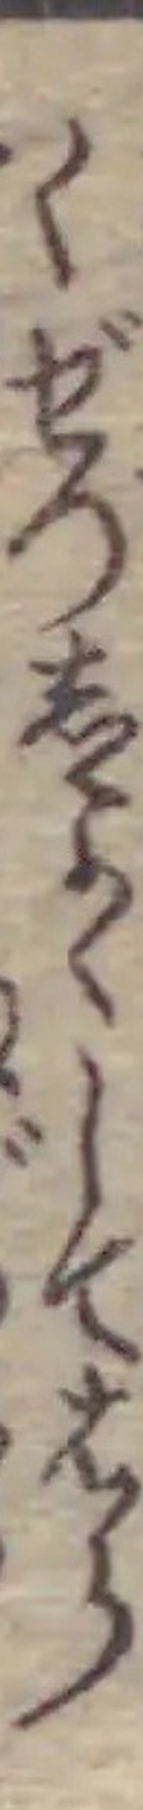くぜつしよくしてはら
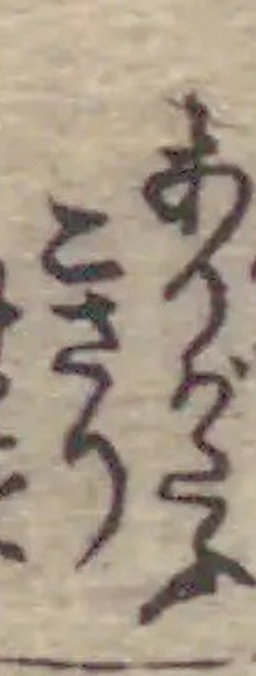こさり
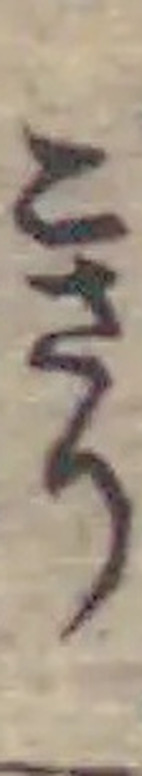こさり
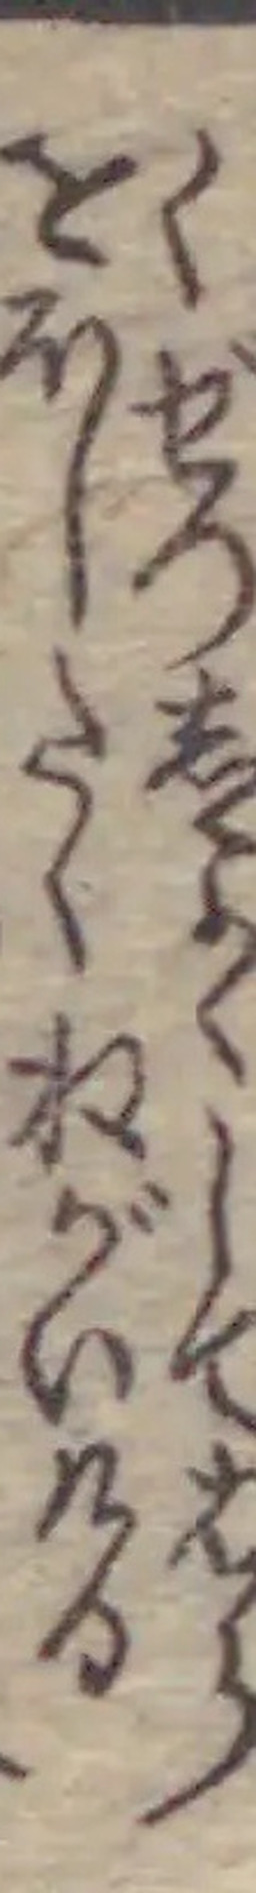をほしたくねがいける
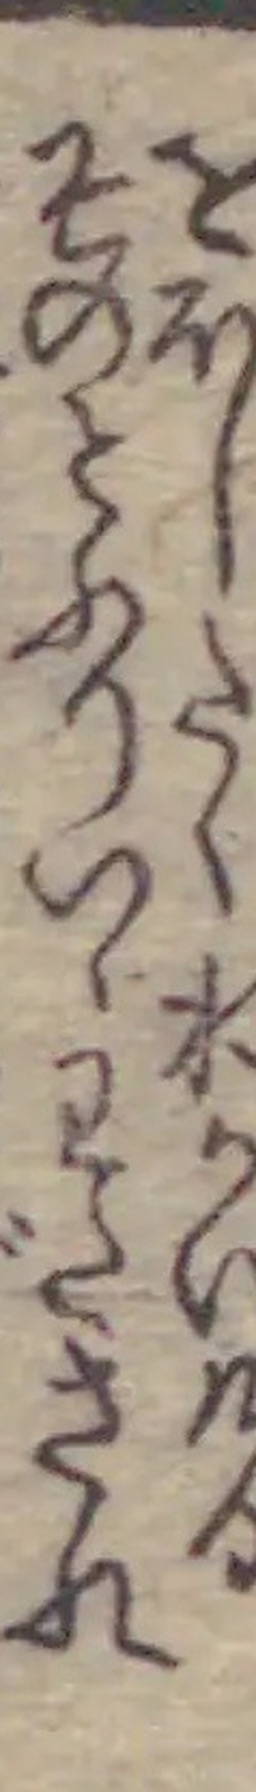そのとふりいゝわたされ
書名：腹内養生主論 3巻
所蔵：国立国会図書館 National Diet Library, JAPAN
